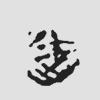屈
